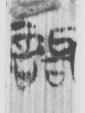詒
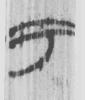于
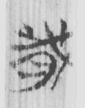歲
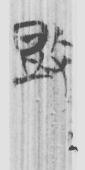{豆攴}
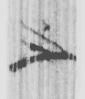之
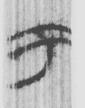于
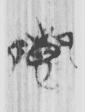鄉
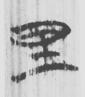里
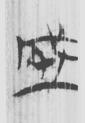城
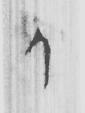人
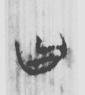曰
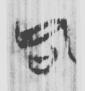句
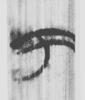于
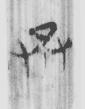{卩廾}
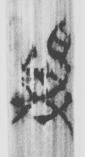嘉
